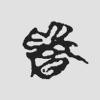晨
